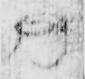尹
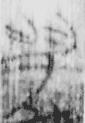○（羽）
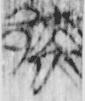郯
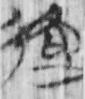○（路）
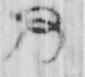尹
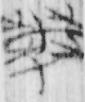發
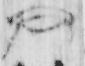尹
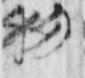利（利）
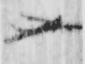之
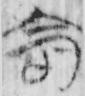命
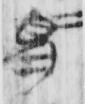{胃刀}（謂）
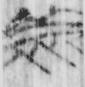羕
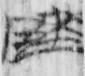陵
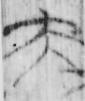大夫
